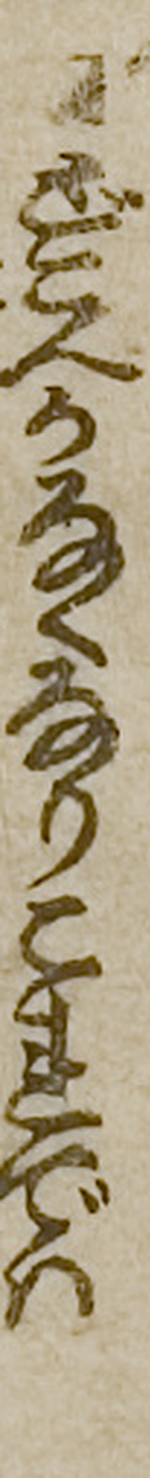どこへかなくなりこれでは
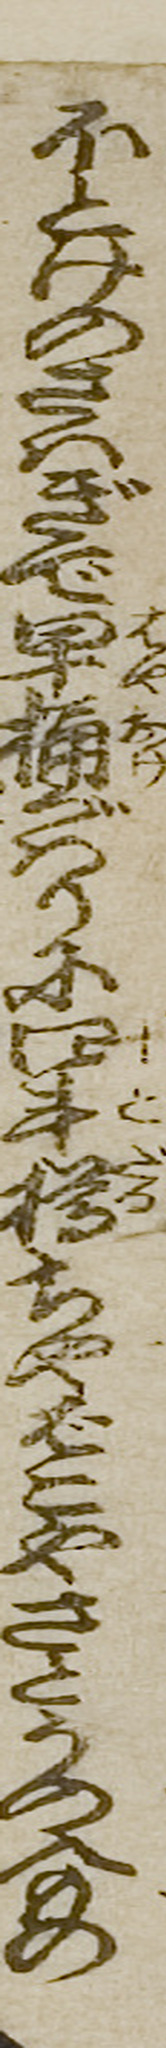ほとけのさはぎで早桶がはりに四斗樽ちやばこやさとうの入もの
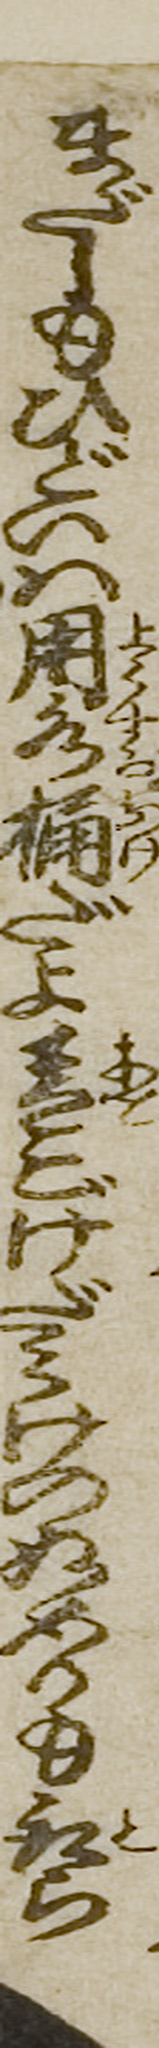まだしもひどいは用水桶だよ青ごけだらけのぬめりも取ら
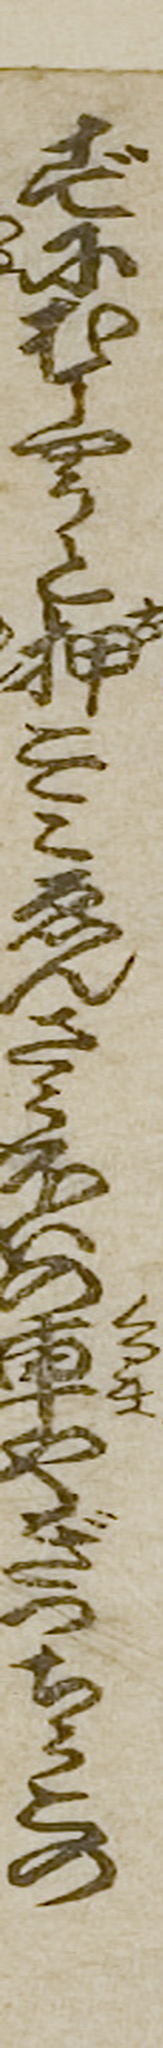ずにむしやうと押こみゑんさかほいの車やぎつちらこの
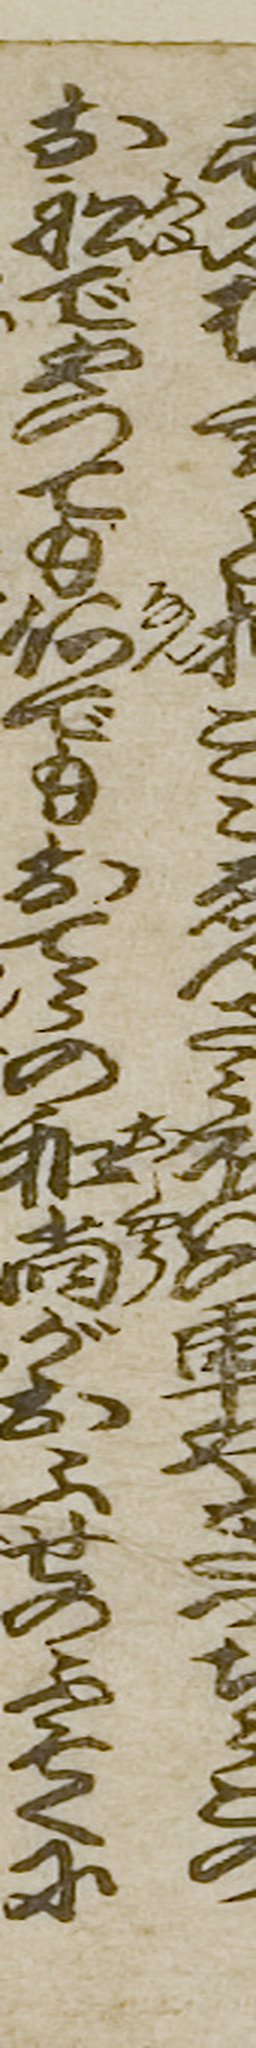お舩でやつても何でもおてらの和尚がおふせのふそくに
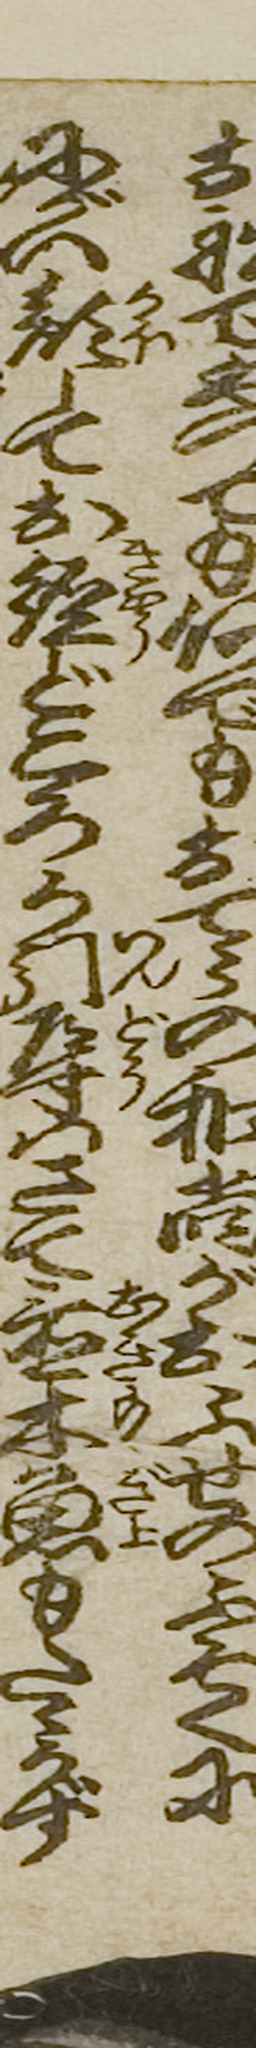にがい顔してお経どころか引導はさて置木魚もたゝかず
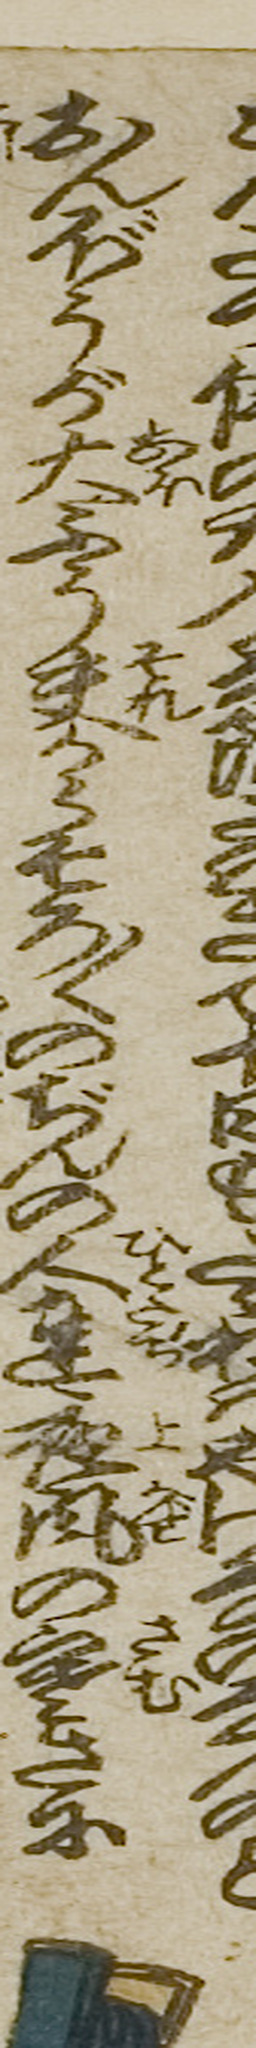おんぼうが大ふう夫からそろ〳〵のぢんの人達夜風の寒きに
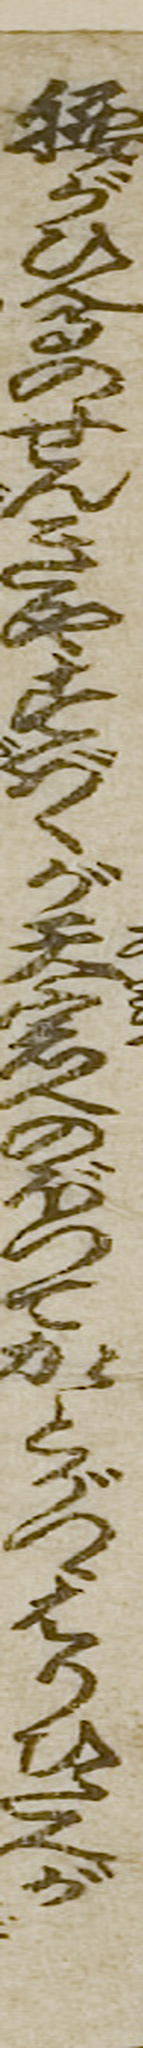腰がひへるのせんきやすばくが天窓へのぼつてかとがつゝはりひたへが
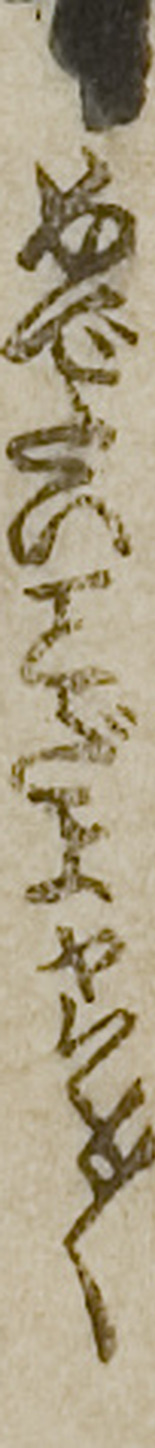めでたいことだよヤレ〳〵〳〵〳〵
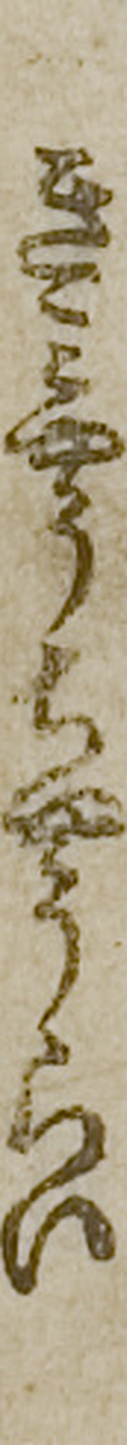きみやうちやうらい
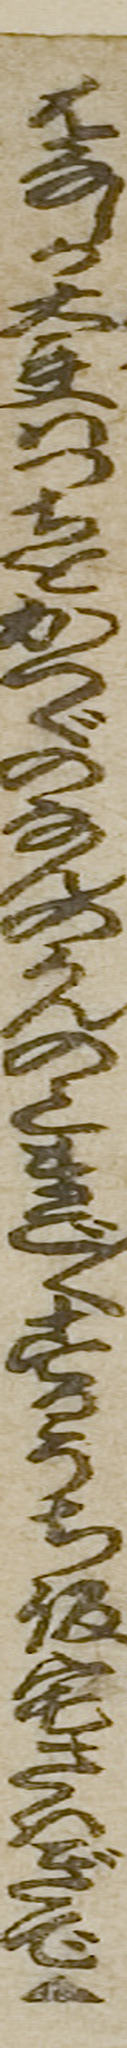はなしか太夫はつちをかつぐのなんのかんのとまご〳〵するうち仮宅さはぎで▲
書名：どらが如来世直し ちょぼくれ
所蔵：東京大学総合図書館 General Library in the University of Tokyo, JAPAN
